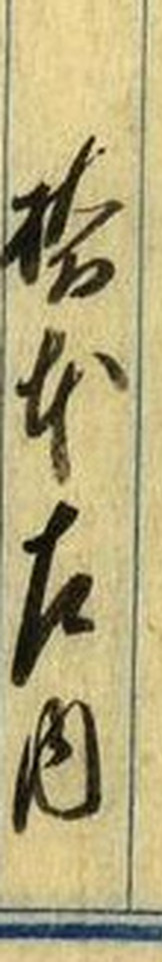橋本左内
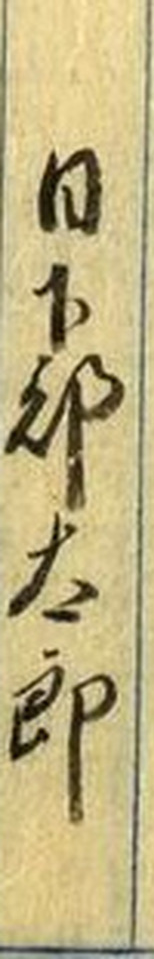日下部太郎
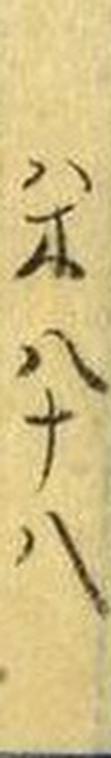八木八十八

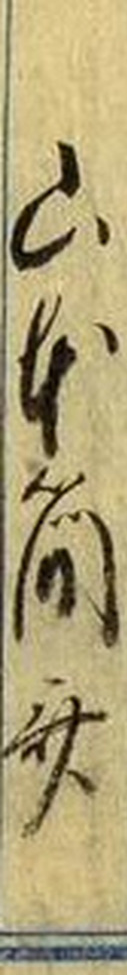山本簡斎
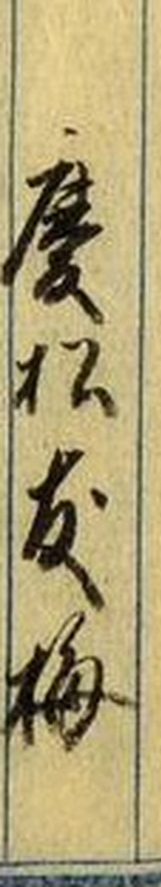慶松友梅
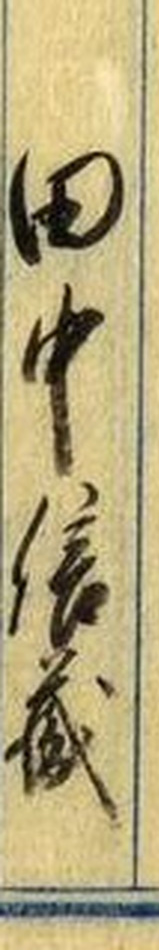田中信蔵
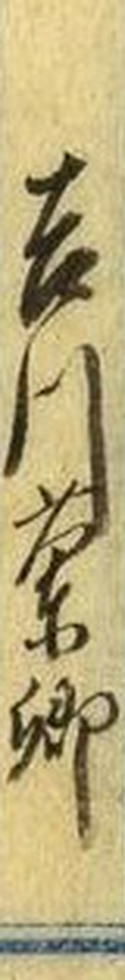吉川蘭卿
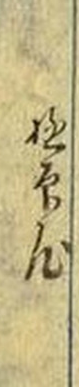極印屋
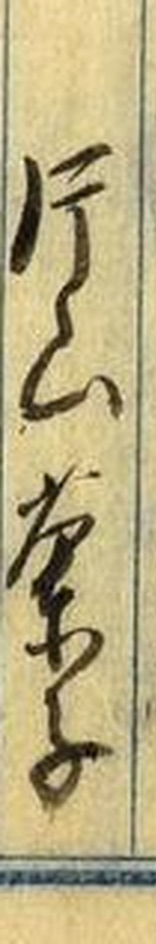片山蘭子

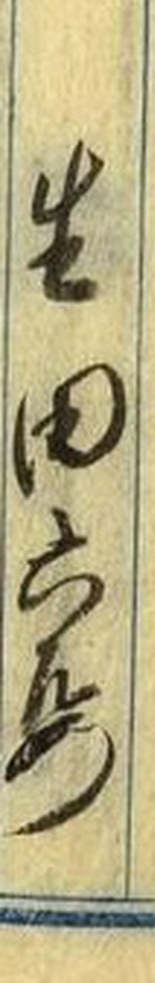生田六左衛門
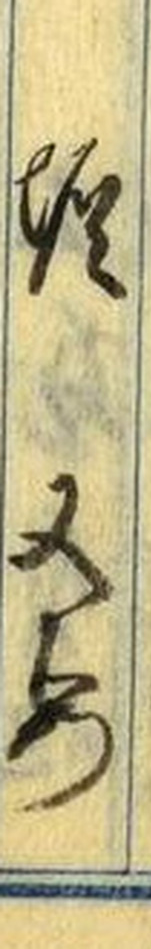堀又右衛門
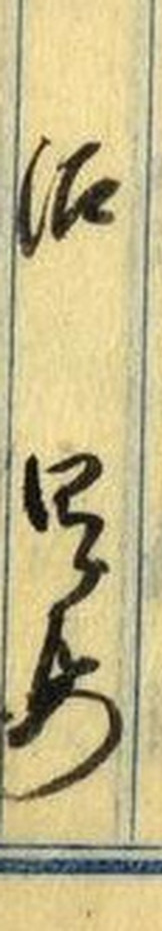沼四郎左衛門

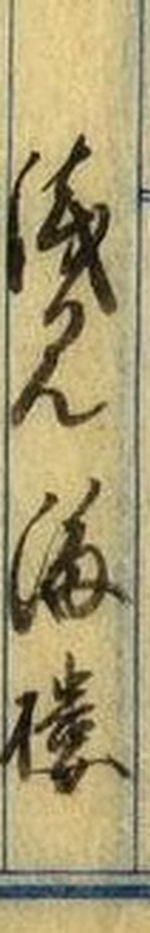浅見海楼
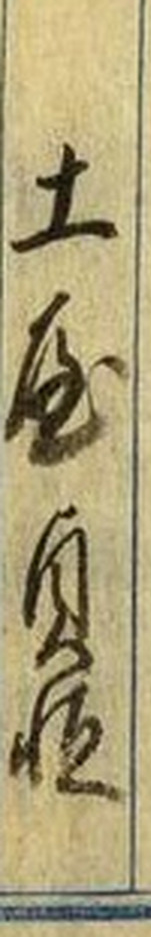土屋貞恒
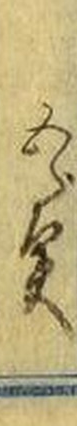五郎太夫
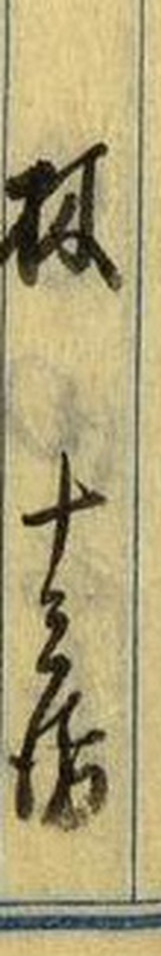林十兵衛
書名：温古集 四巻
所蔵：福井県文書館 Fukui Prefectural Archives
